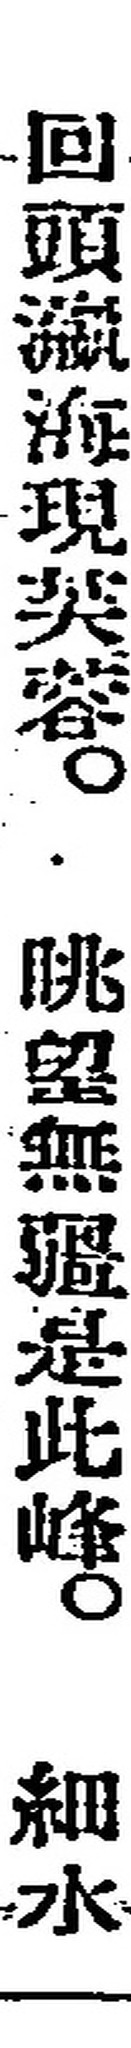回頭灜海現芙蓉。眺望無疆是此峰。細水
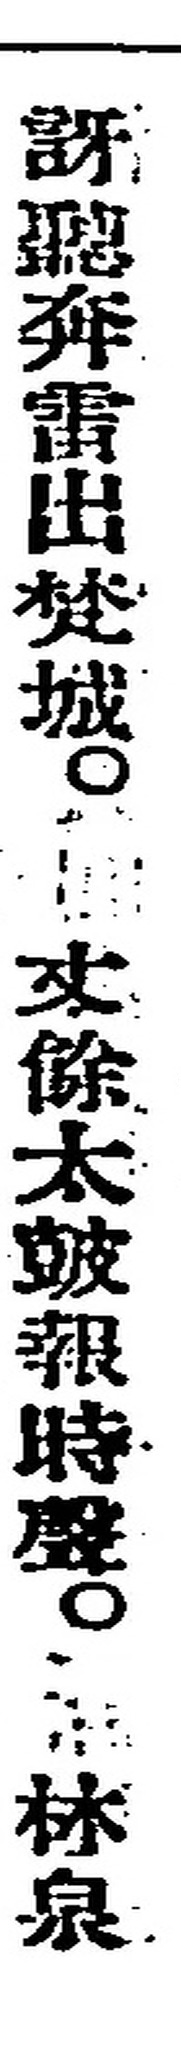訝聴奔雷出梵城。丈余太皷報時声。林泉
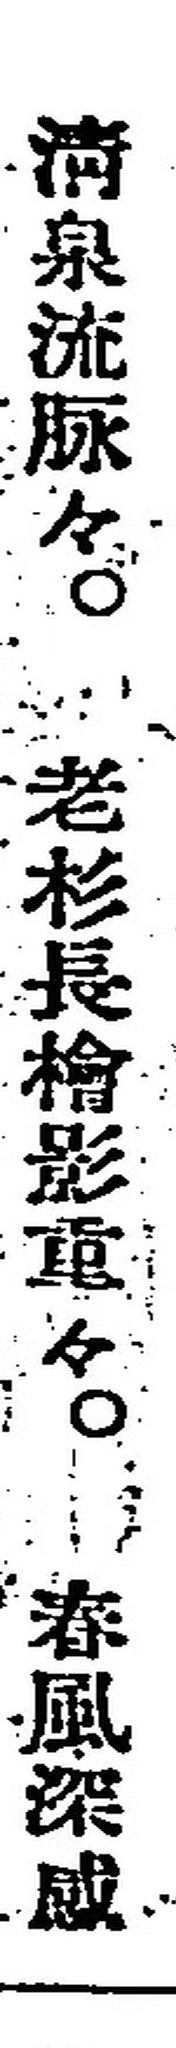清泉流脉々。老杉長檜影重々。春風深感
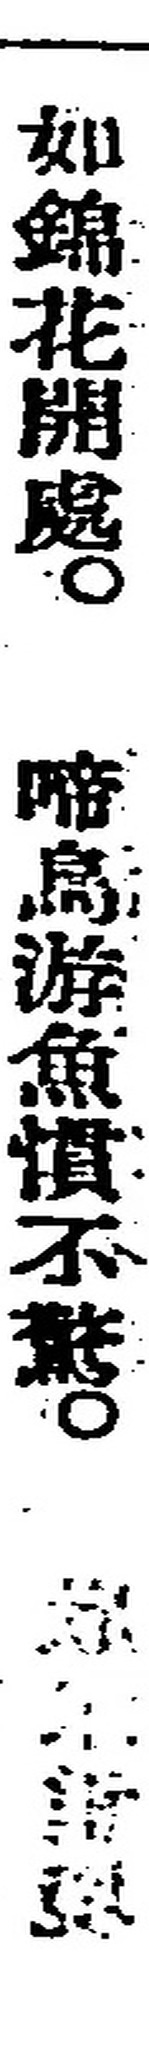如錦花開処。啼鳥游魚慣不驚。
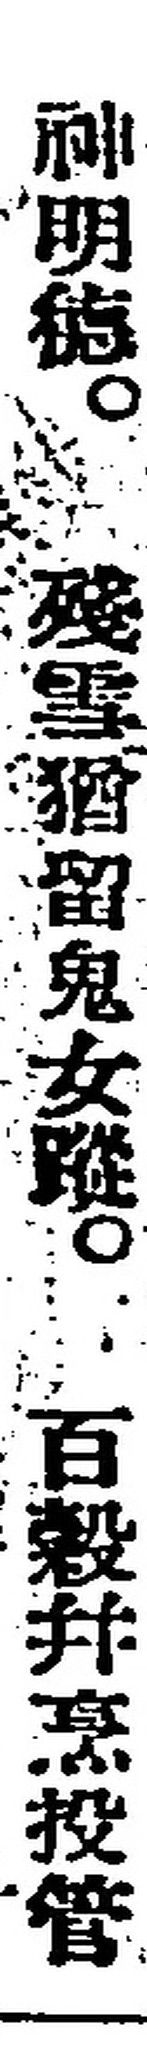神明徳。残雪猶留鬼女蹤。百穀并烹投管

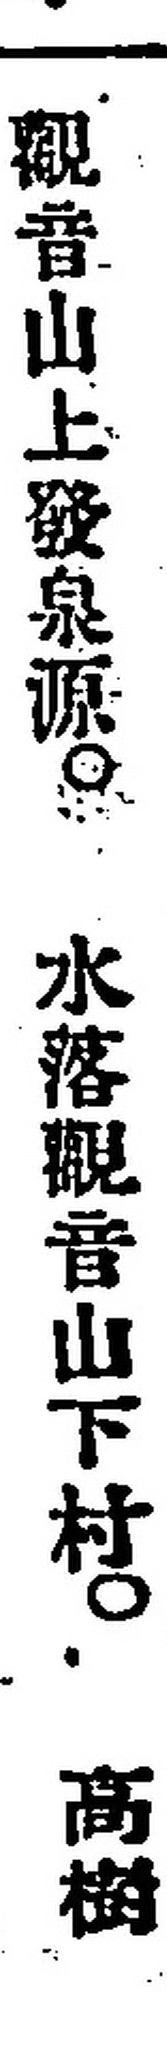観音山上発泉源。水落観音山下村。高樹
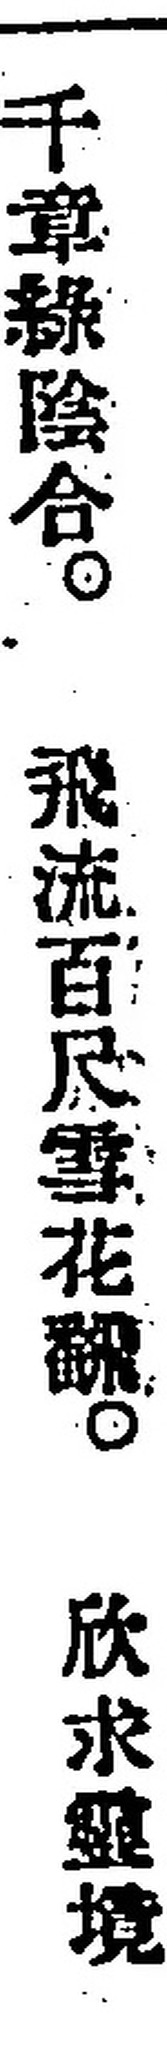千章緑陰合。飛流百尺雪花翻。欣求霊境
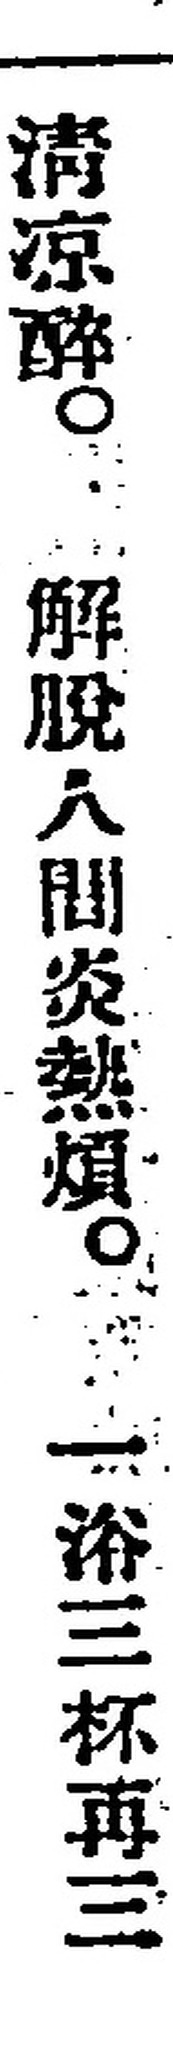清涼酔。解脱人間炎熱煩。一浴三杯再三
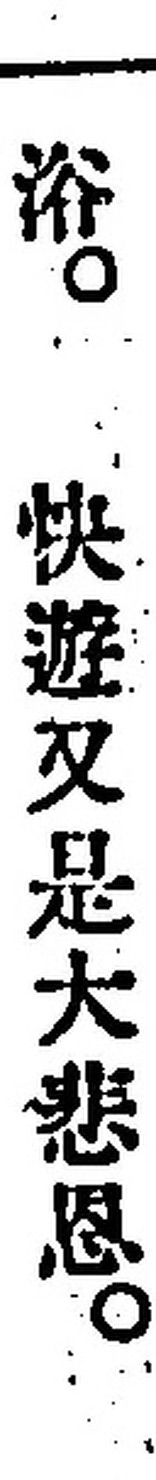浴。快遊又是大悲恩。
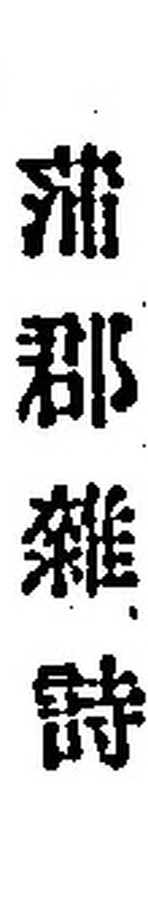蒲郡雑詩
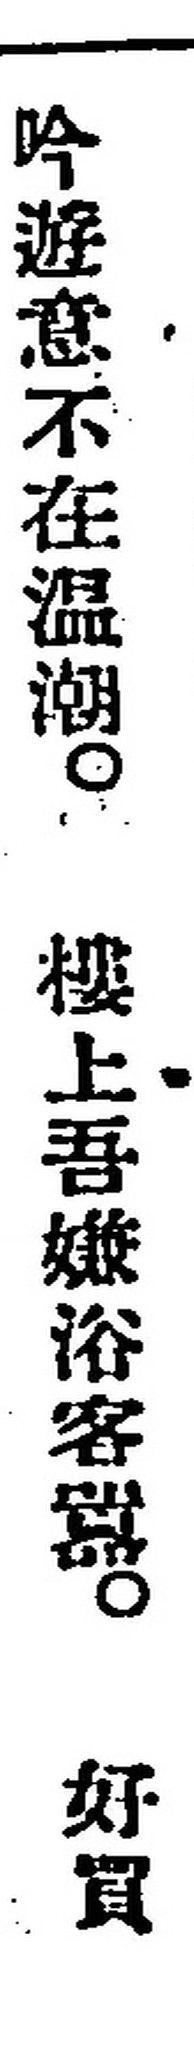吟遊意不在温潮。楼上吾嫌浴客囂。好買
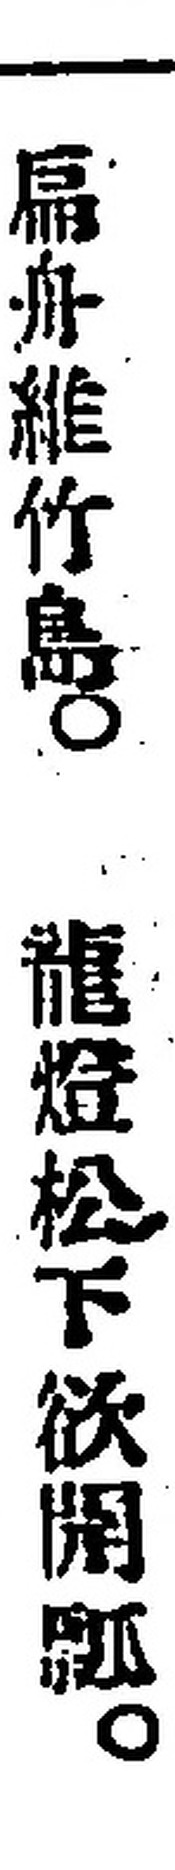扁舟維竹島。龍燈松下欲開瓢。
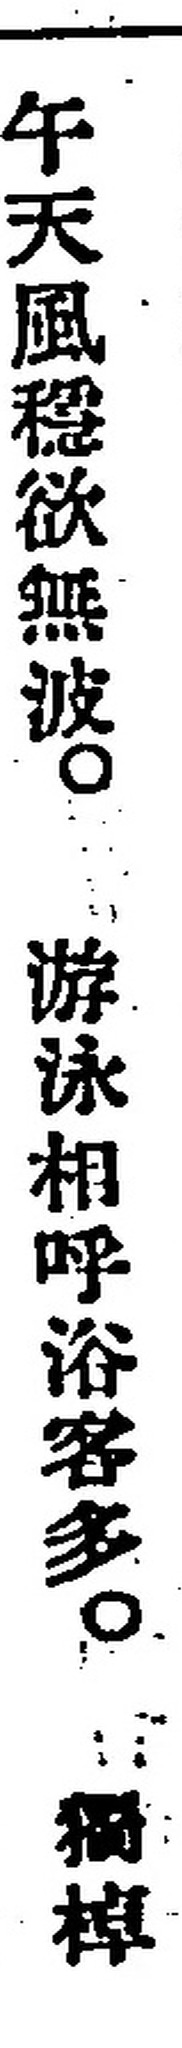午天風穏欲無波。游泳相呼浴客多。独棹
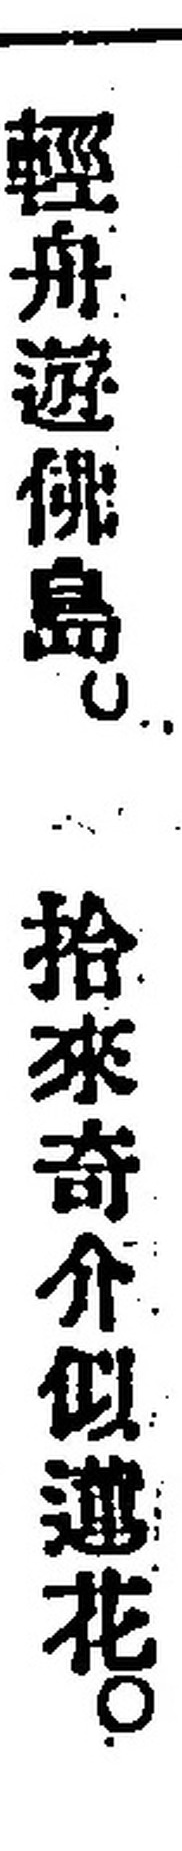軽舟遊仏島。拾来奇介似蓮花。
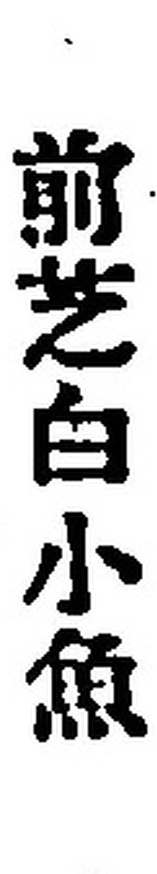前芝白小魚
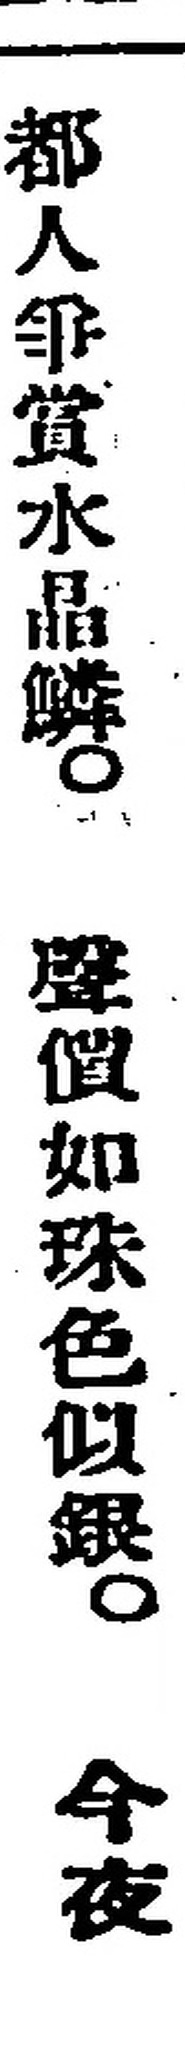都人争賞水晶鱗。声価如珠色似銀。今夜
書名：東参名勝案内
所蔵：国立国会図書館 National Diet Library, JAPAN
